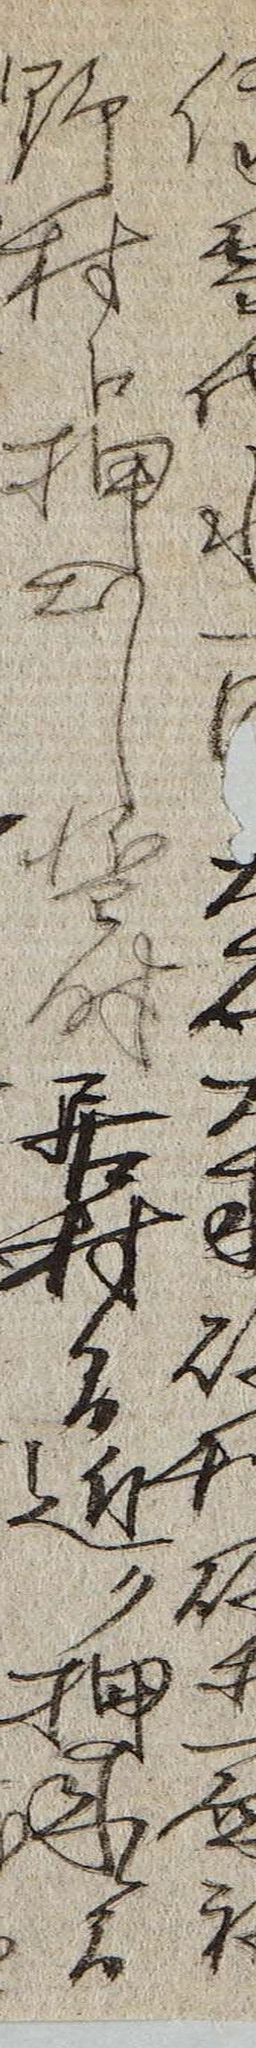野村へ押出し暫時居村間近く押来候間
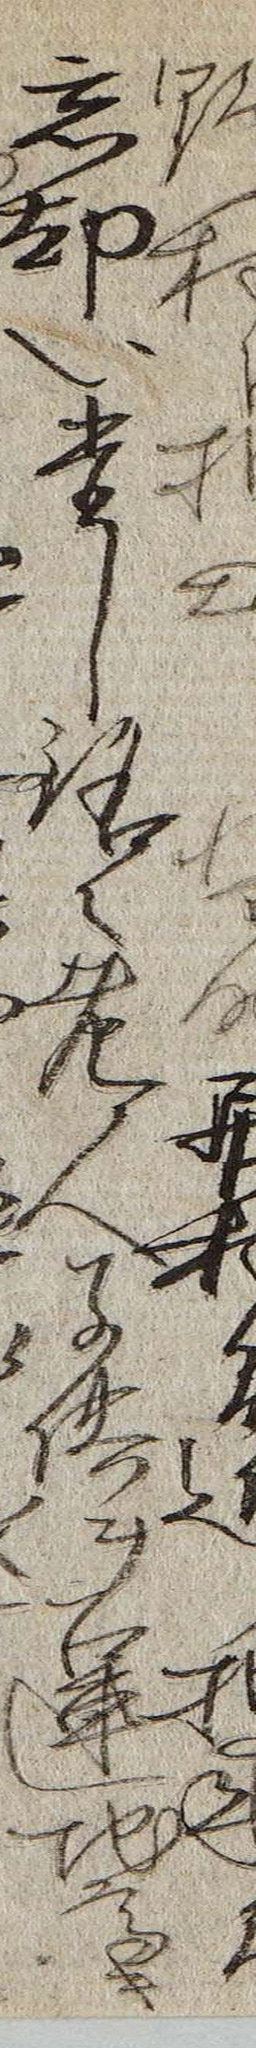忘却いたし銘々老人子供を召連地高き
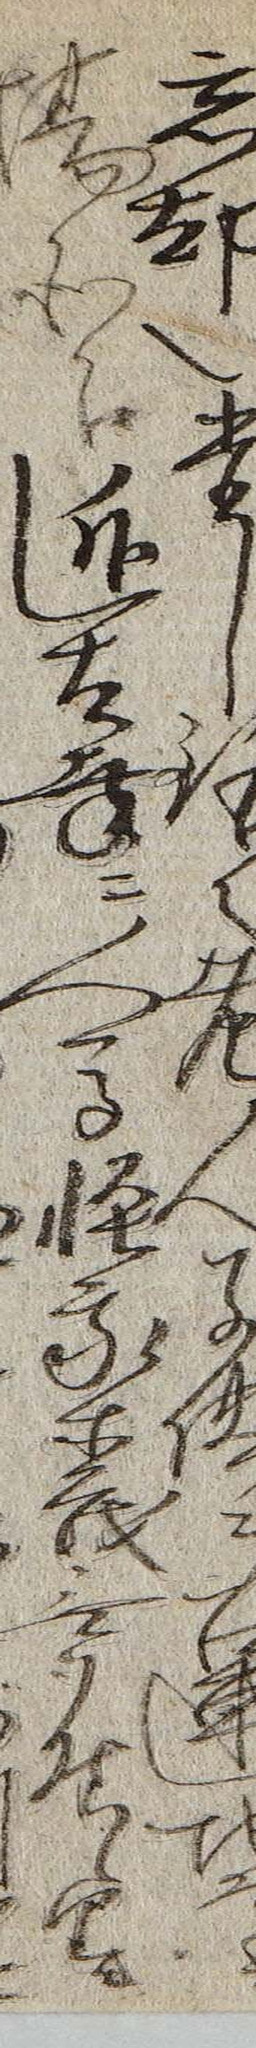場所へ逃去幸にじ人馬怪我等も無御座候
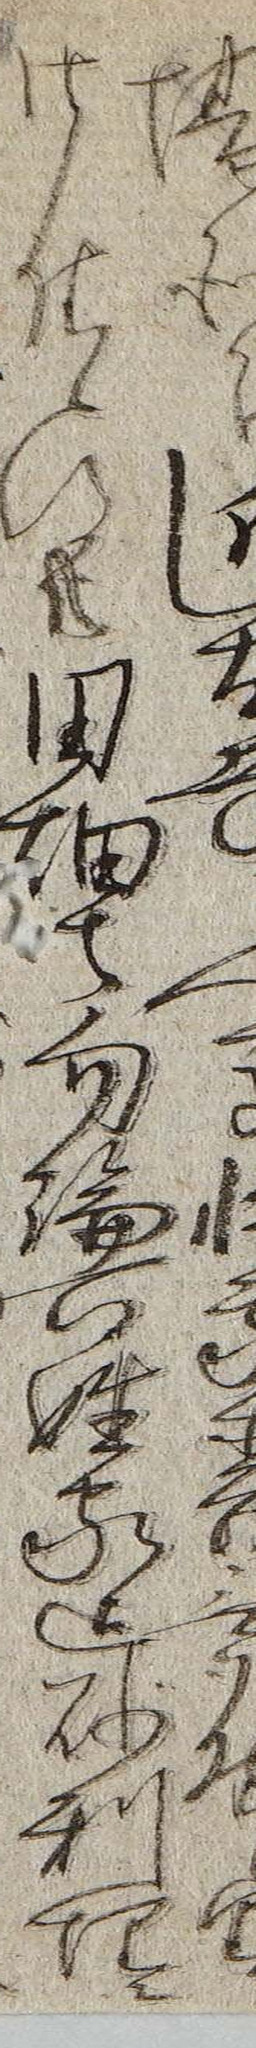仕候得ども田畑は勿論百姓家まで砂利埋に
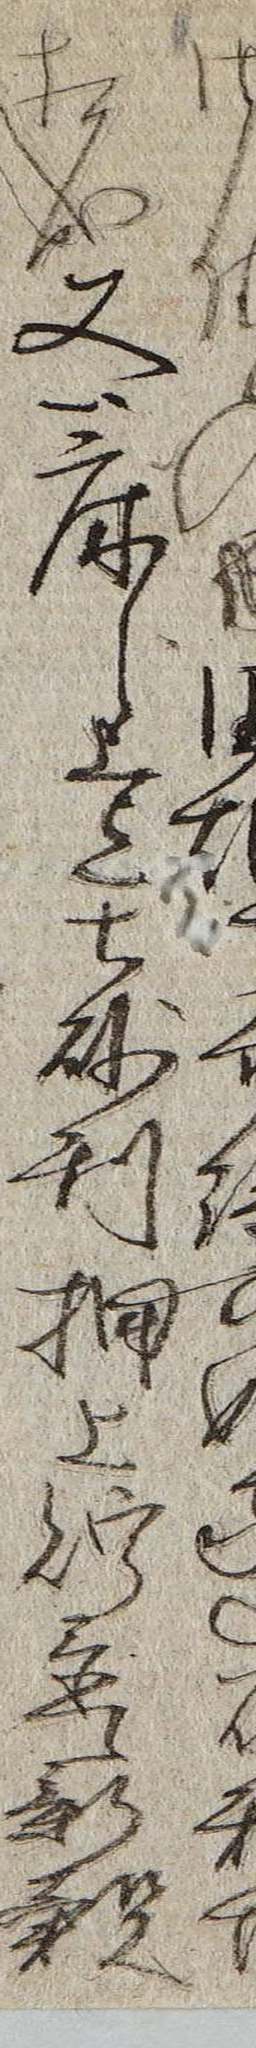相成又は床の上まで土砂利押上貯置候新穀
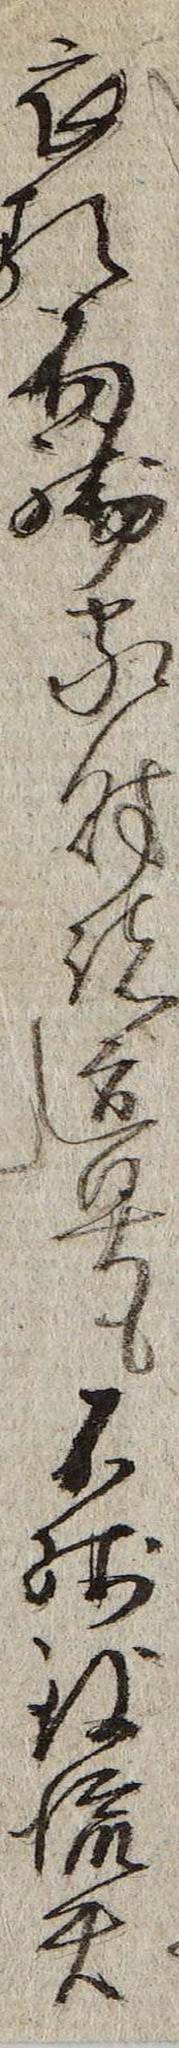衣類は勿論家財諸道具も不残致流失
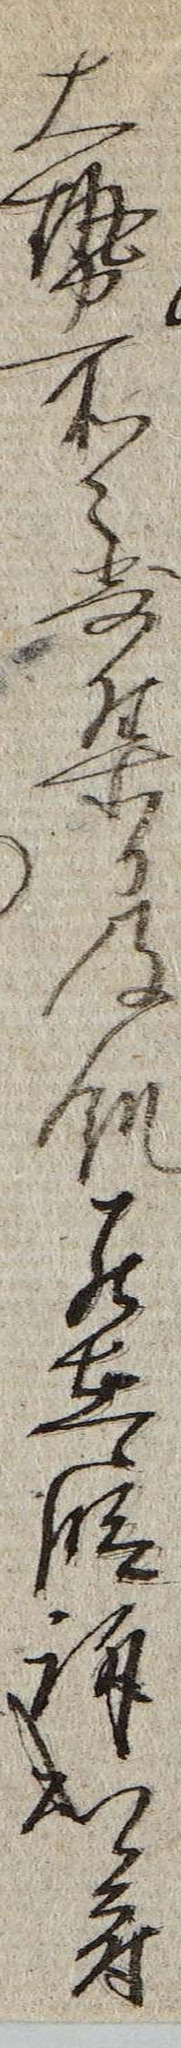大勢所々寄集り及飢罷在候段訴成候に付
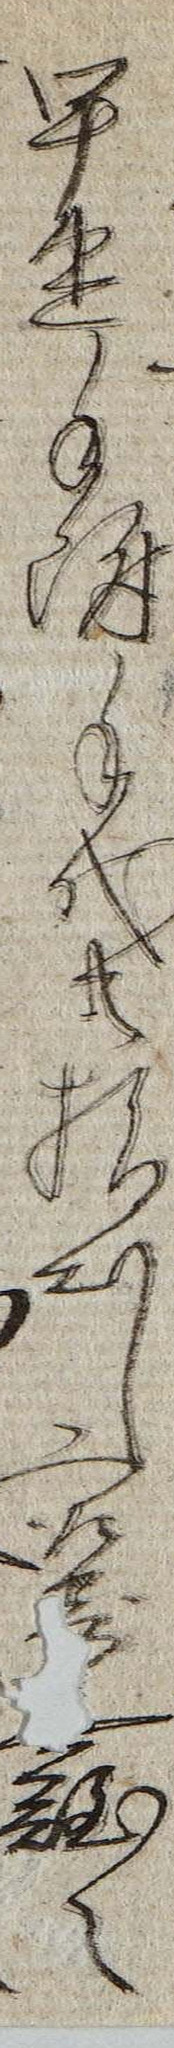早速手附手代ども指出し最寄無難の
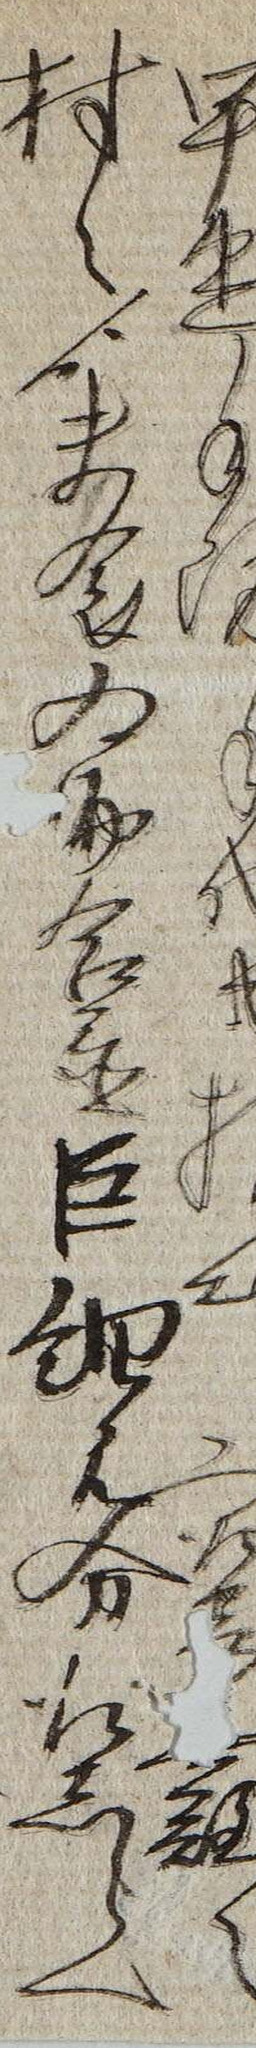村々より夫食為助合置巨細見聞取しらべ
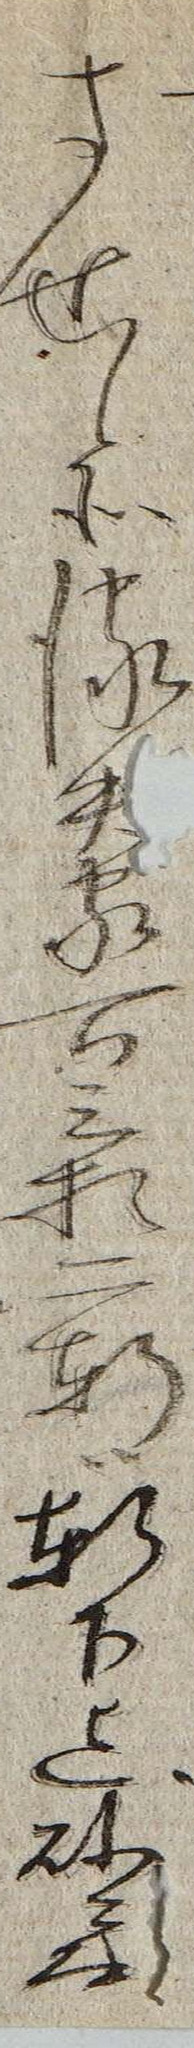させ候所流失家百三十二軒は軒下迄砂にて
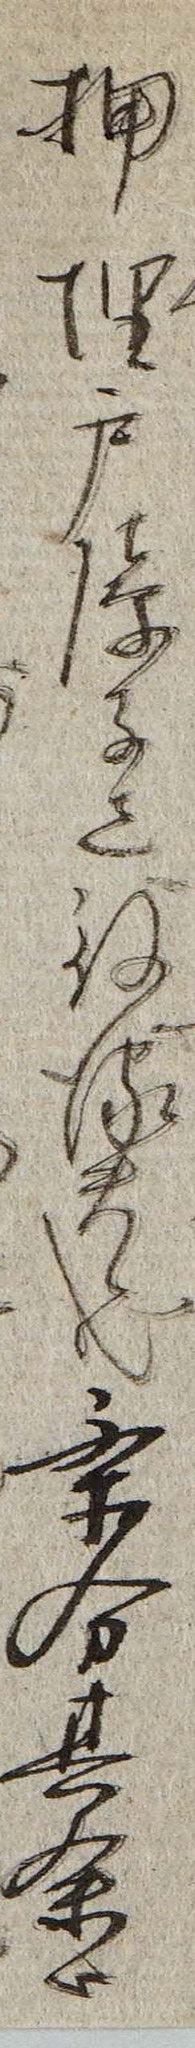押埋戸障子まで致流失候哉不相分其余は
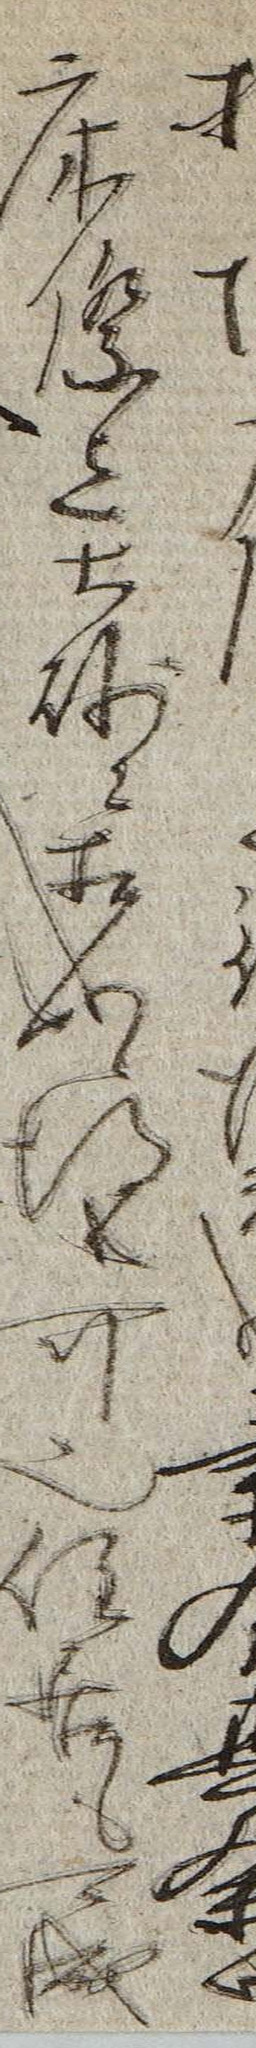床際まで土砂に相成候得ども可也住居も可成
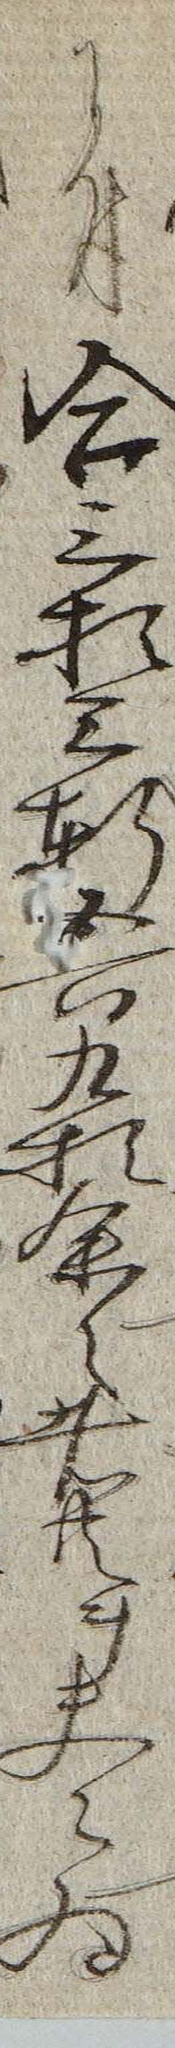に付合三十三軒五百九十余の者どもを夫々為
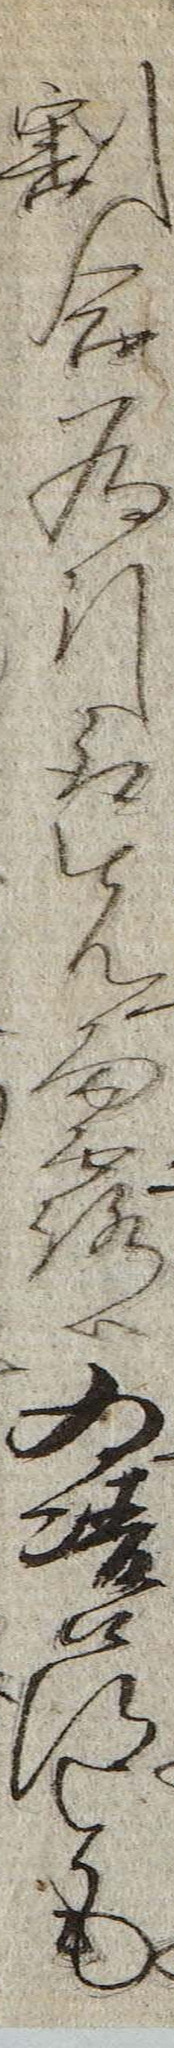割合為引取先雨露は為凌候得とも
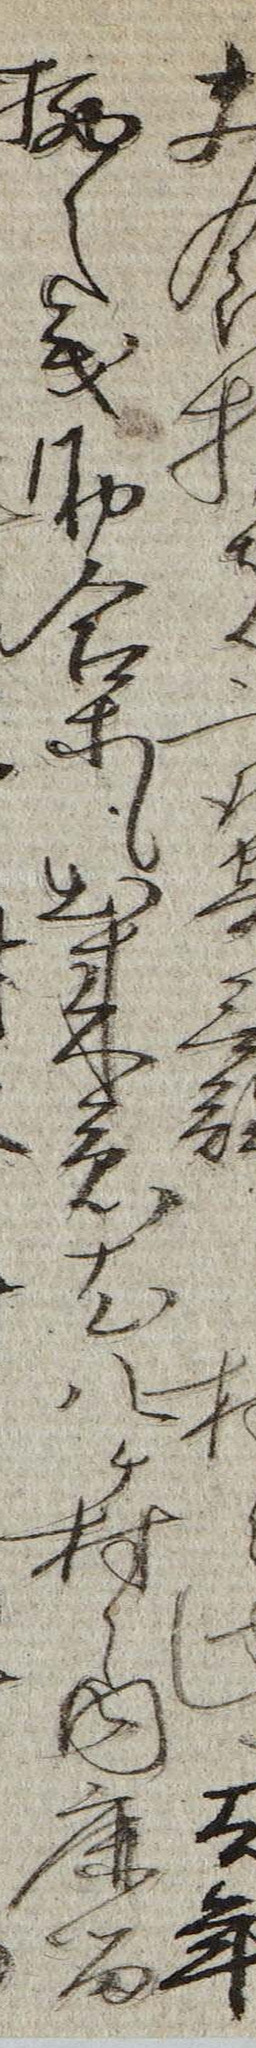の義助合等も出来兼尤八ケ村の内鹿留
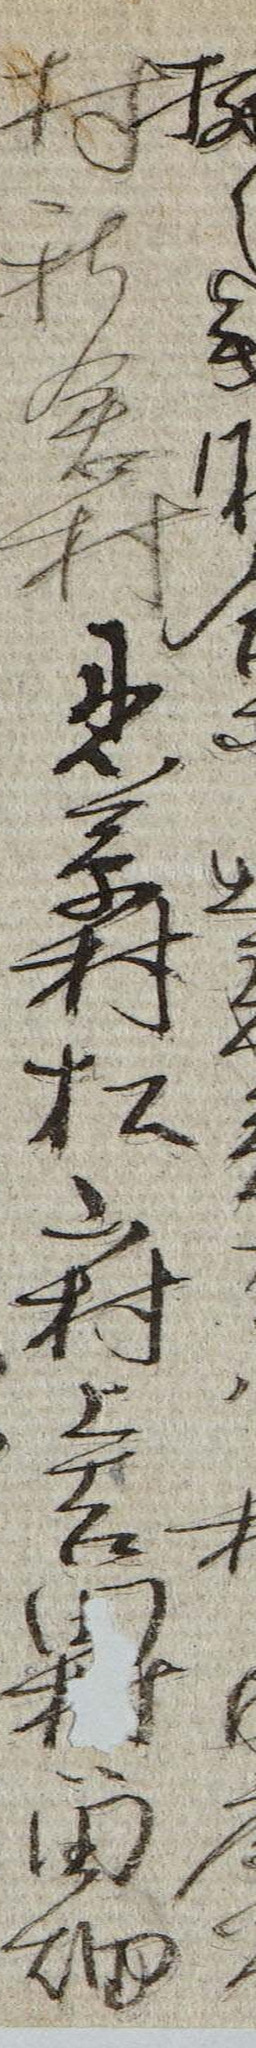村新倉村忍草村松山村上吉田村は田畑
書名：能登国清兵衛異国江漂流之始末
